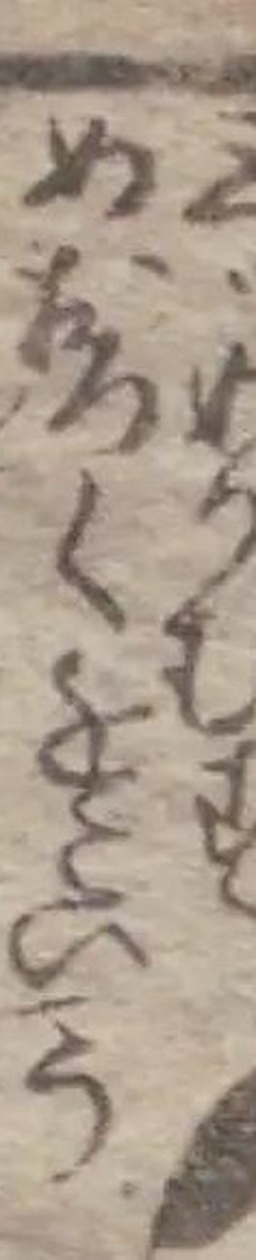めおろくをこいう
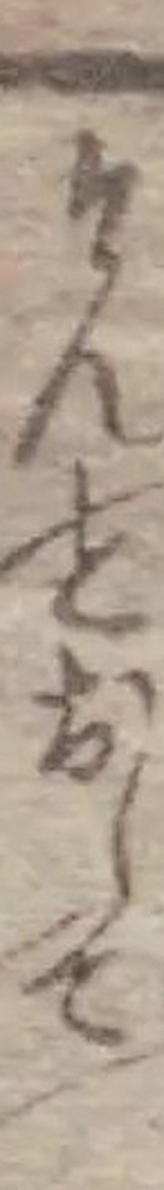けんとおして

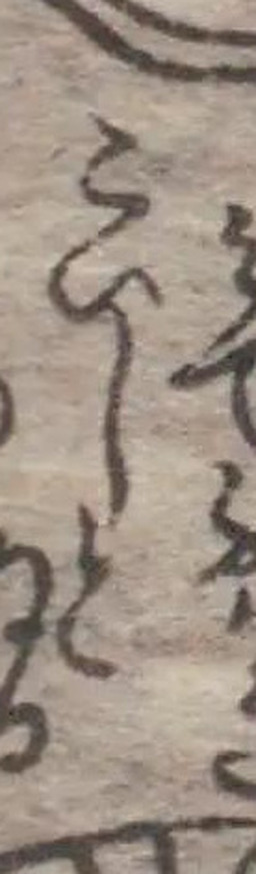こいしと
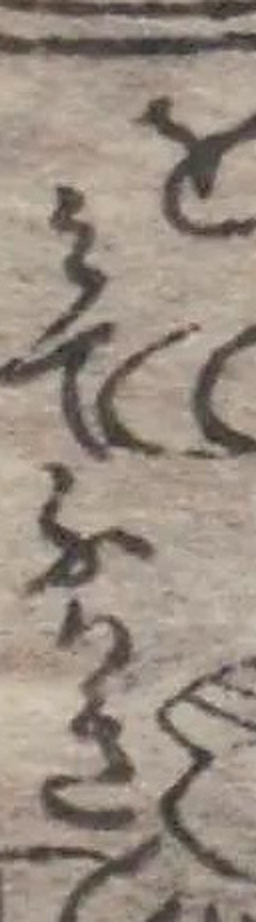みてふかき

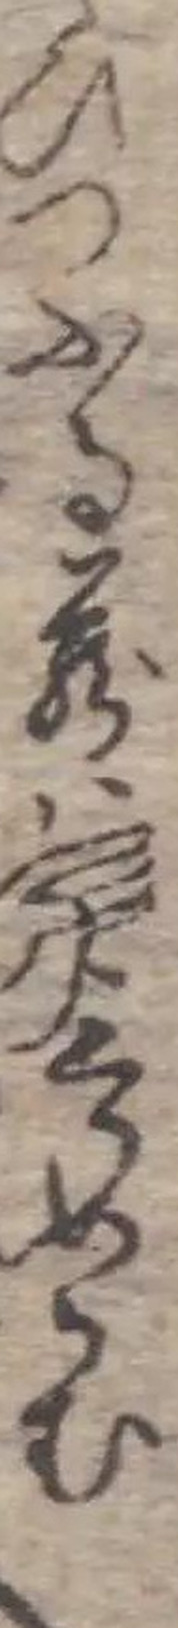めしひつふる蔵は三つめかむ
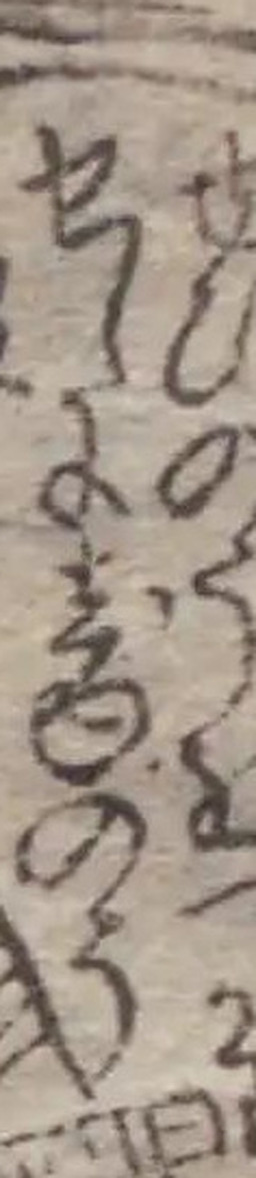せしにしゆのう
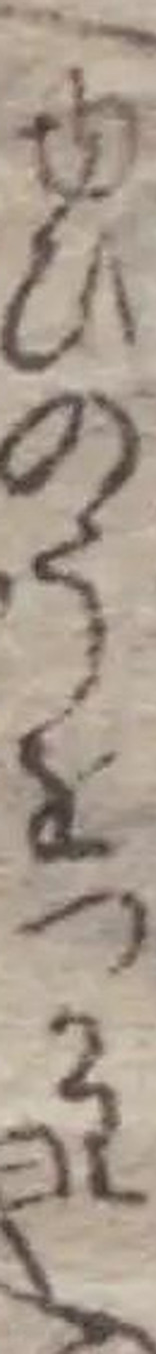ゆひのうをつかわ
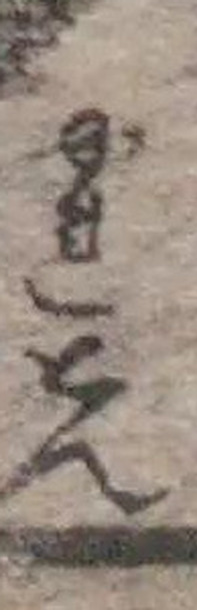やれとん
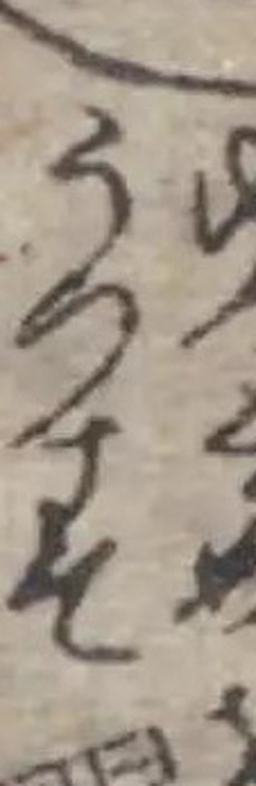うつすて
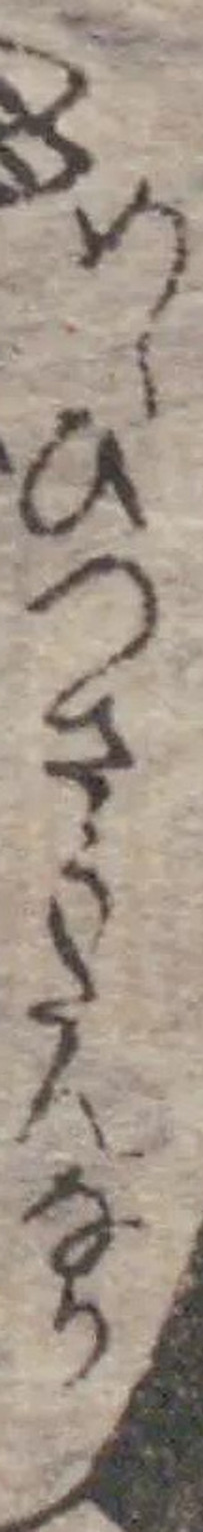めしひつさうたんなか
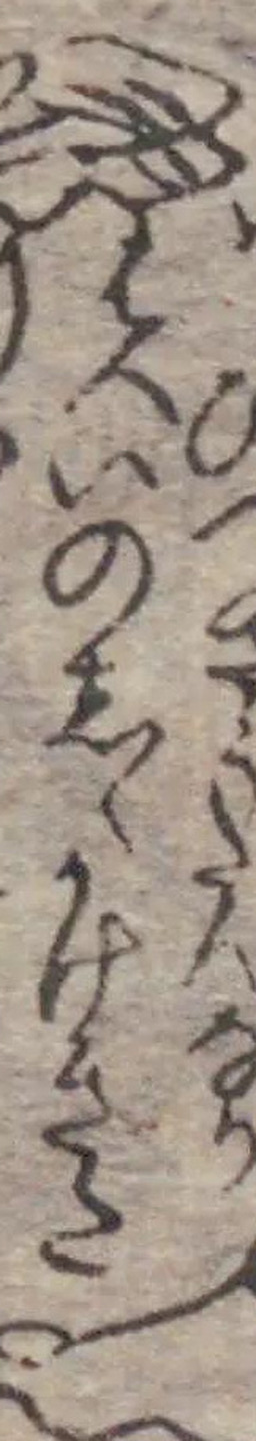はへいのしゝかけきた
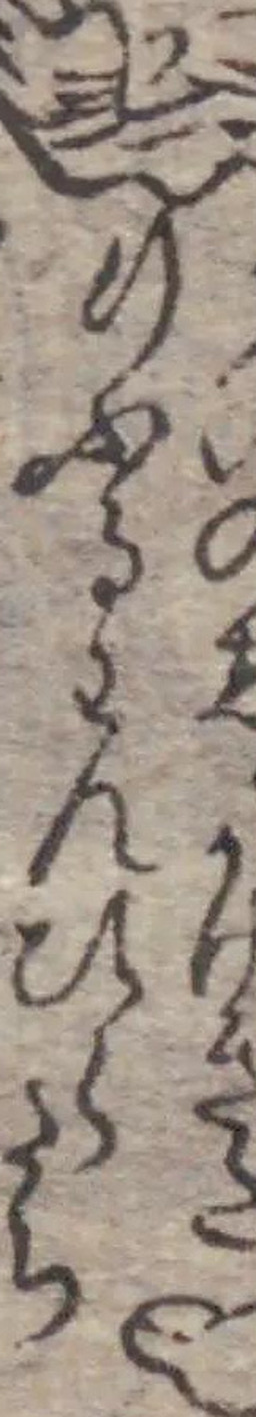りふるわんひらさら
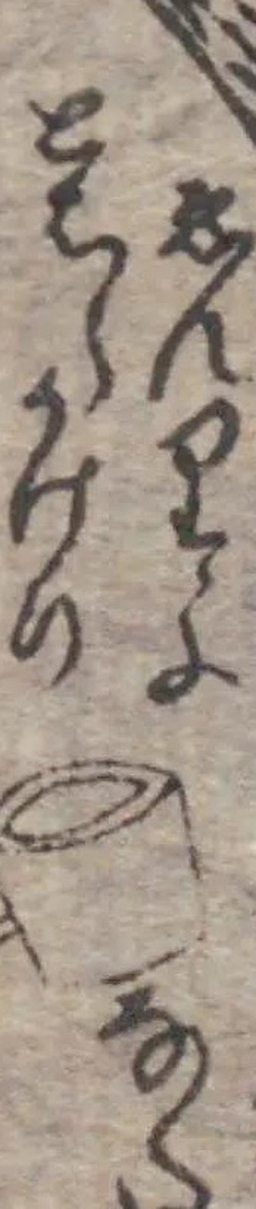とはしかけり
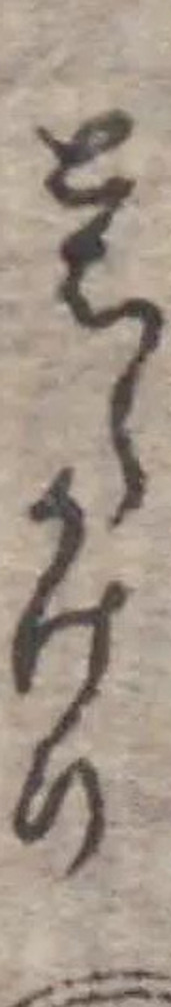とはしかけり
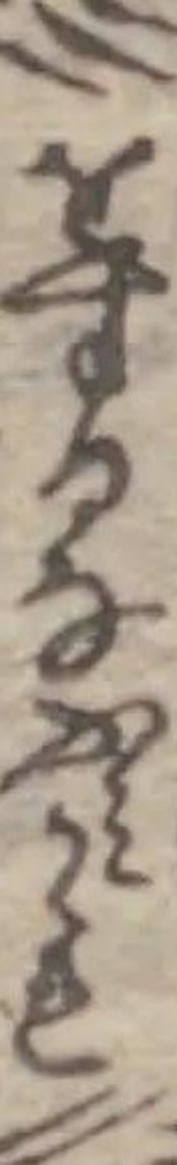をするなふみかゝれ
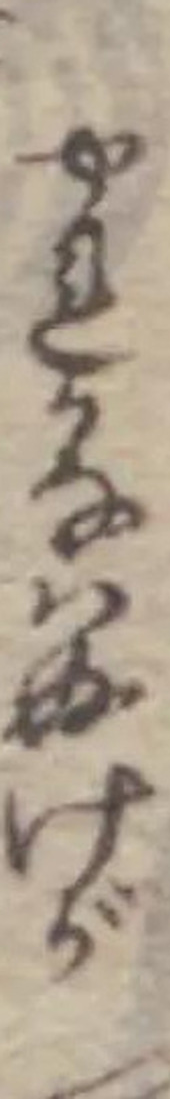やれかなはぬけが
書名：化物三ツ目大ほうい 2巻
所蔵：国立国会図書館 National Diet Library, JAPAN
